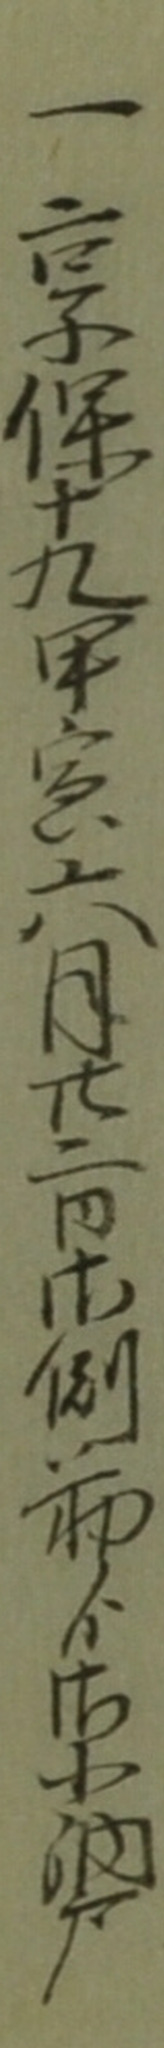一享保十九甲寅六月廿二日御側勤ゟ御小納戸
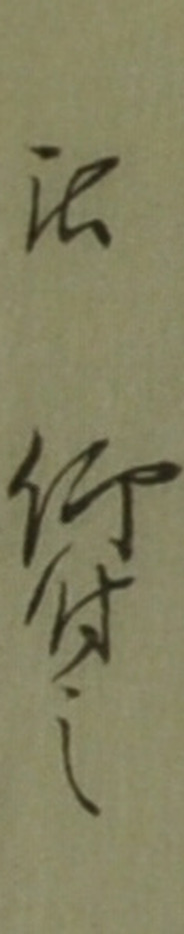被仰付之
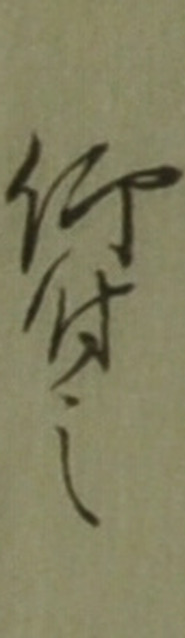仰付之
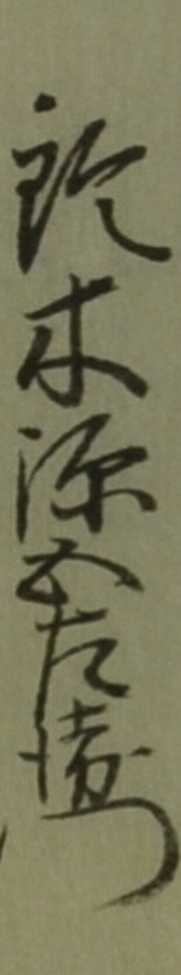鈴木源五左衛門
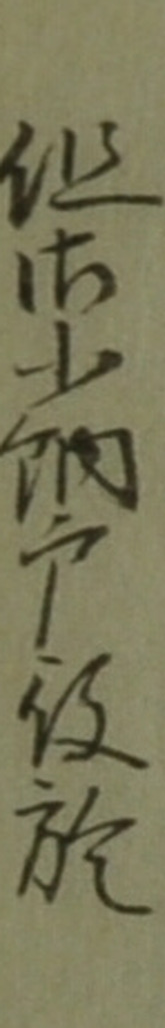但御小納戸役於
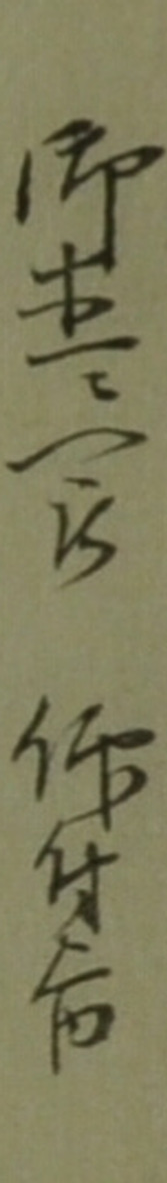御直ニ可被仰付旨
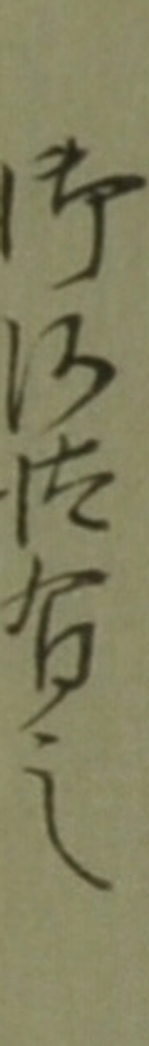御沙汰有之
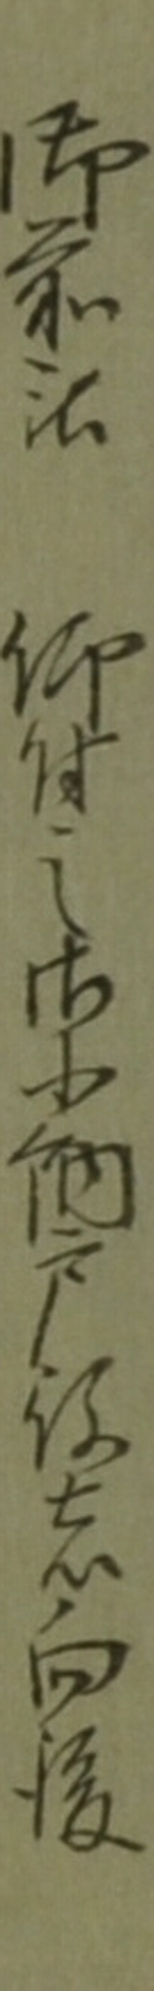御膳被仰付之御小納戸役者向後
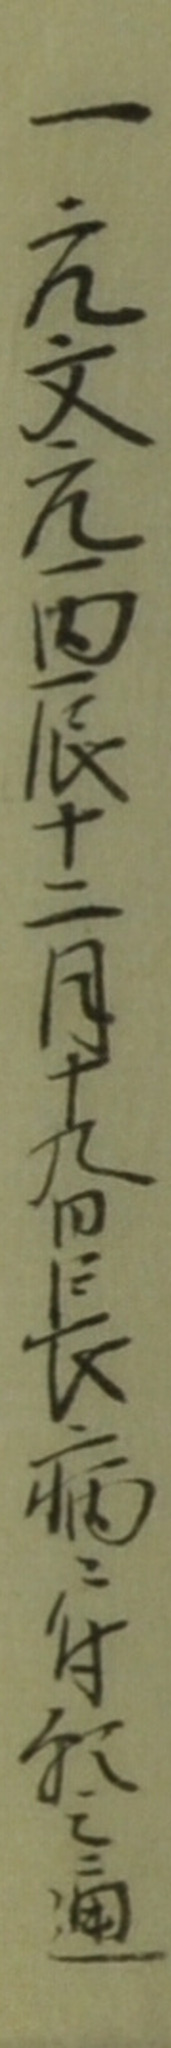一元文元丙辰十二月十九日長病ニ付願之通

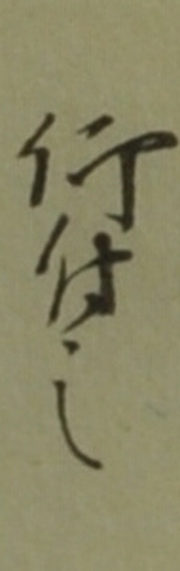仰付之
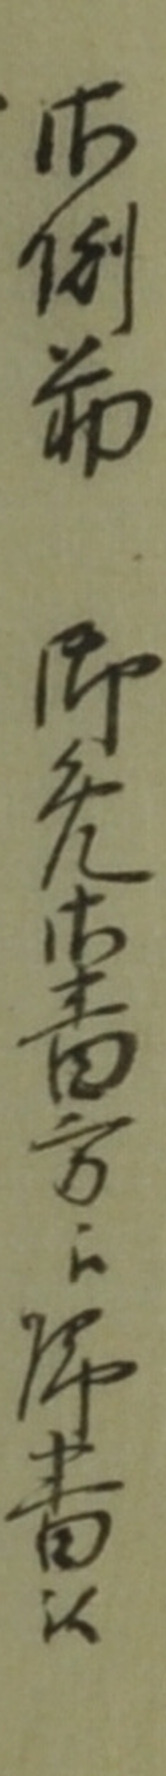御側勤御免御番方江帰番被
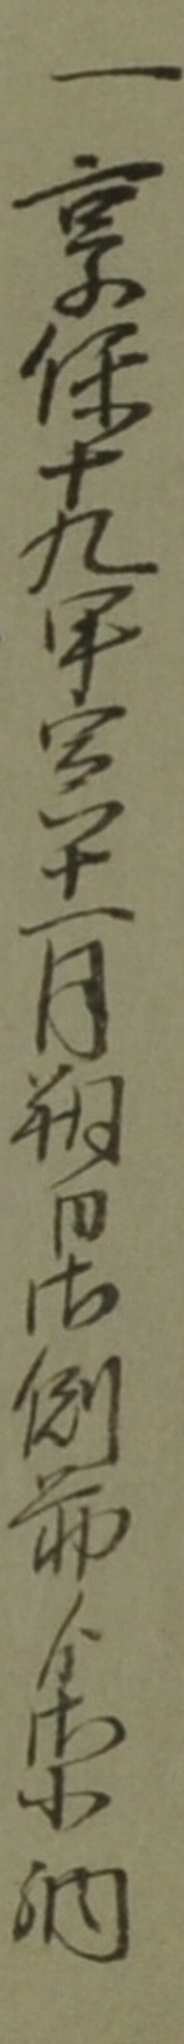一享保十九甲寅十一月朔日御側勤ゟ御小納
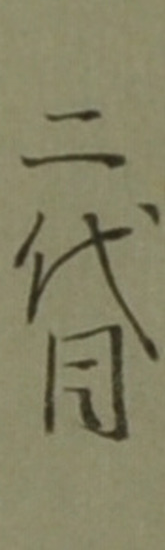二代目
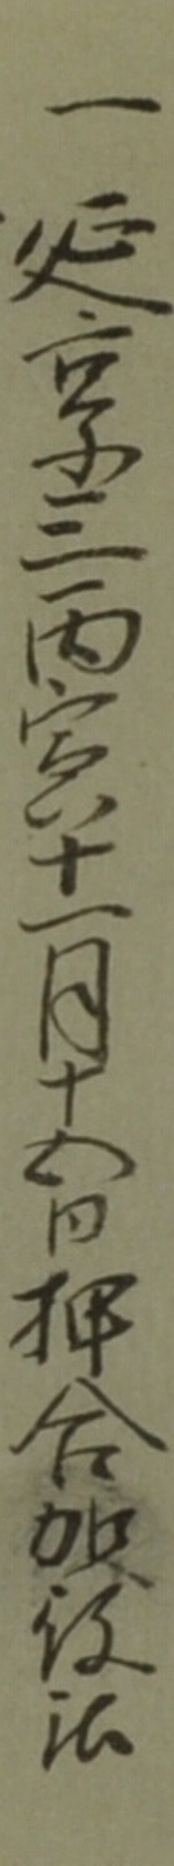一延享三丙寅十一月十五日押合加役被
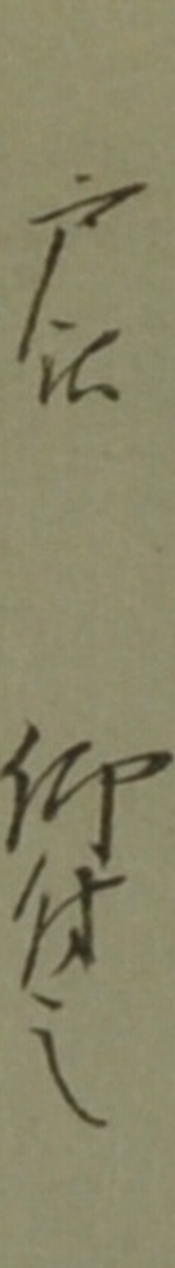戸被仰付之
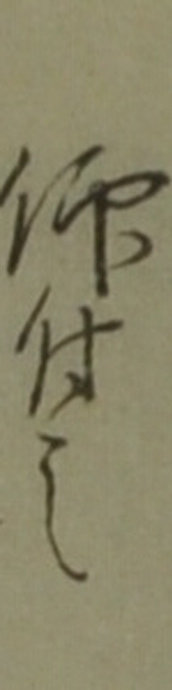仰付之
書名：諸御役代々録（四）
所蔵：伊那市立高遠町図書館・合同会社AMANE
